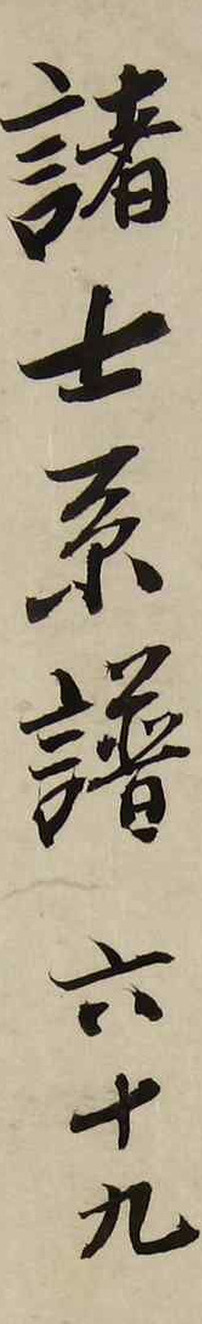諸士系譜六十九

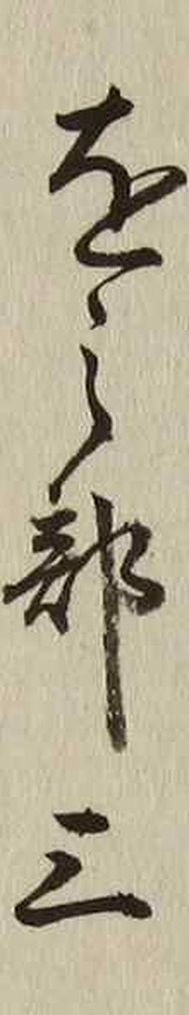を之部三
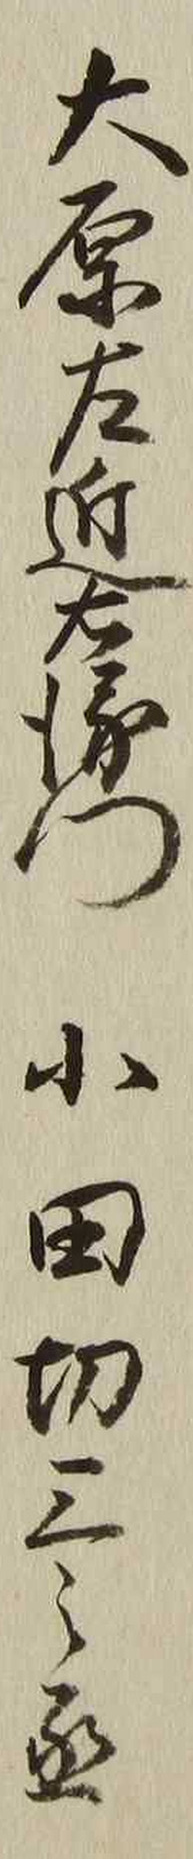大原左近右衛門小田切三之丞

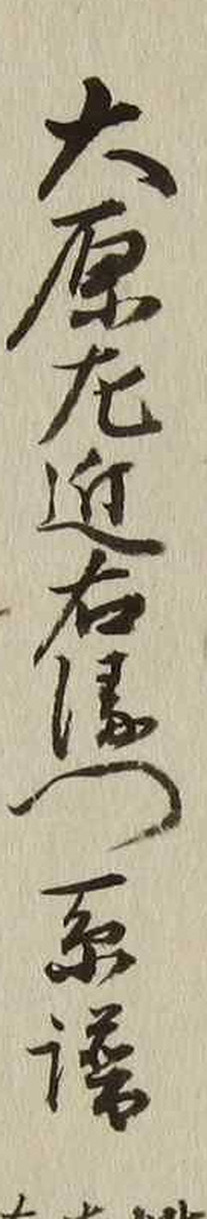大原左近右衛門久勝
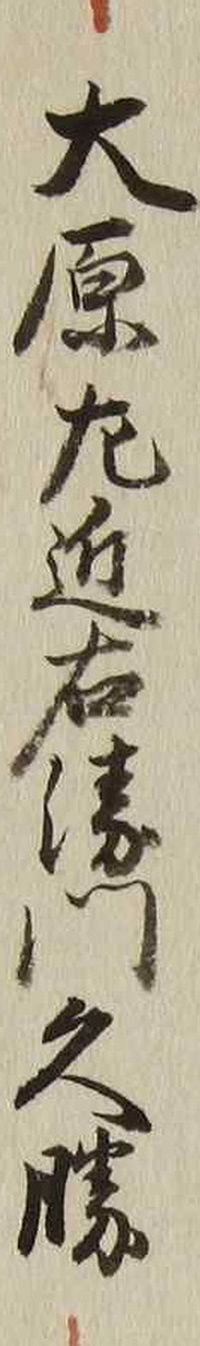大原左近右衛門久勝
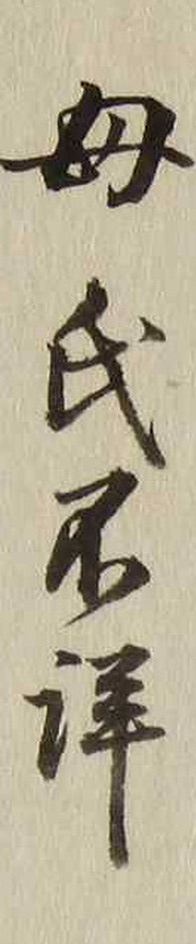母氏不詳
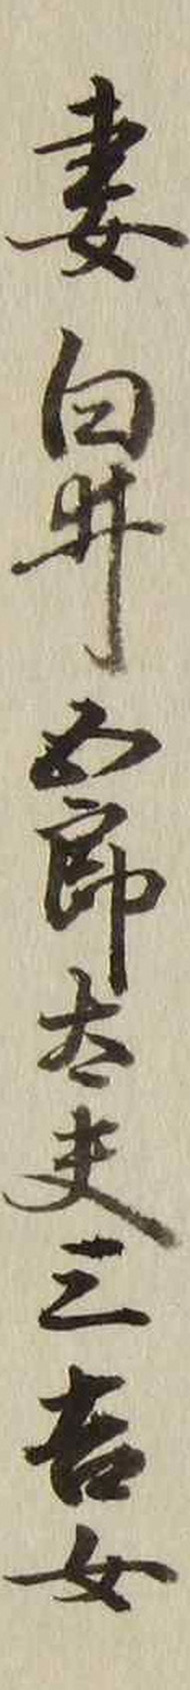妻向井五郎太夫三吉女
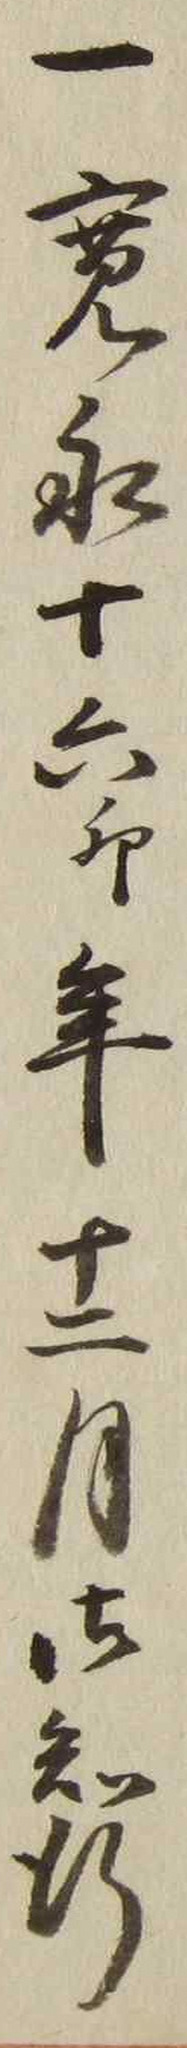一寛永十六卯年十二月御知行

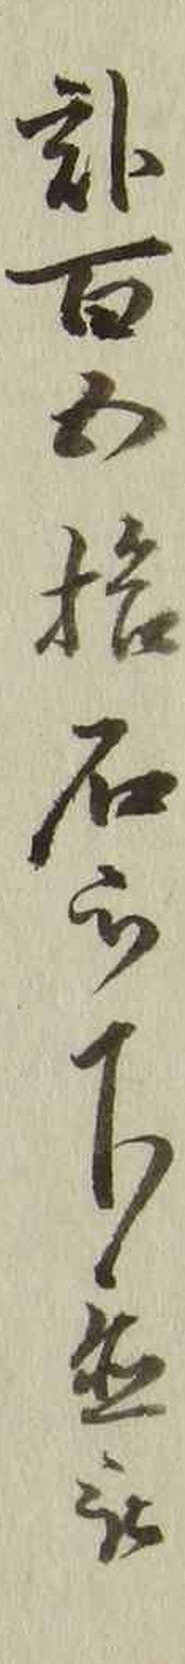御加増五拾石被下置事
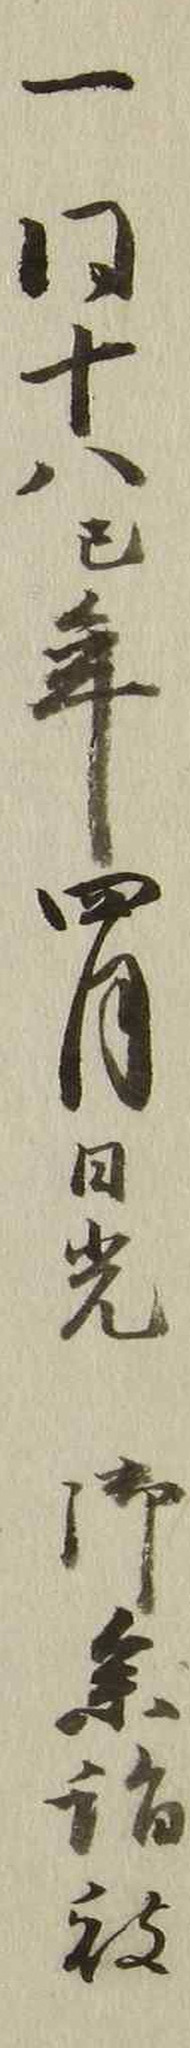一同十八巳年四月日光御参詣被
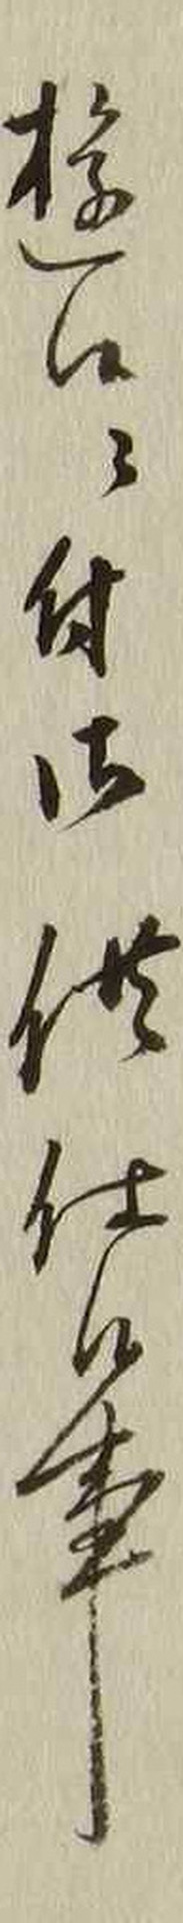遊候ニ付御供仕候事
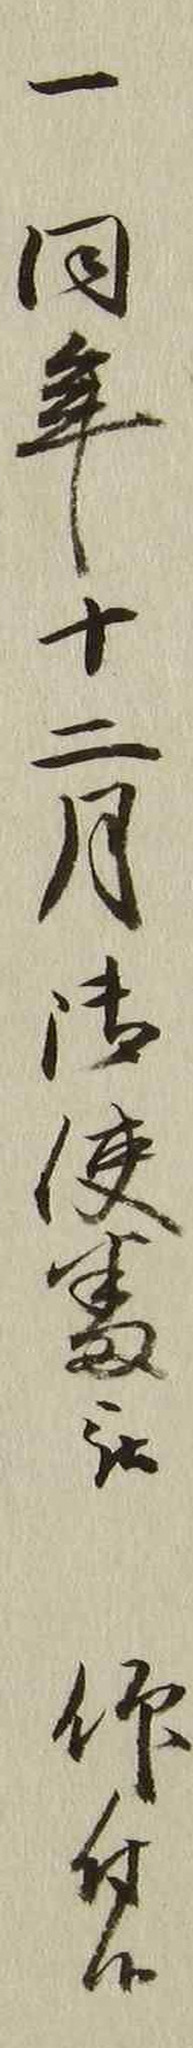一同年十二月御使番被仰付候
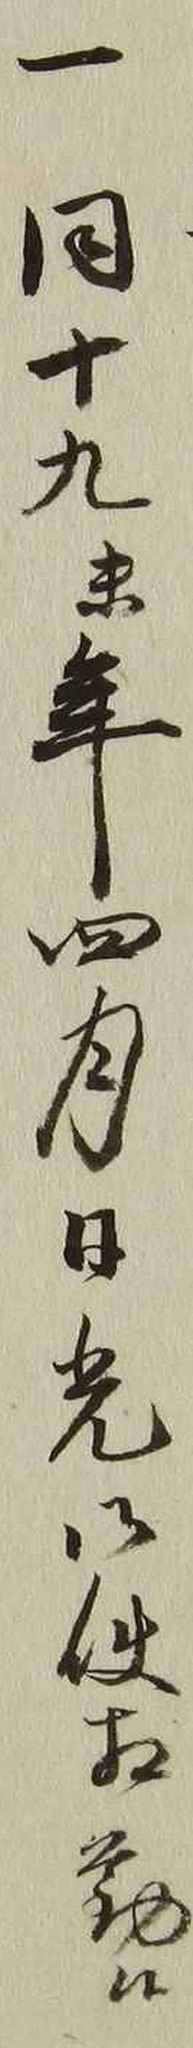一同十九未年四月日光御使相勤候
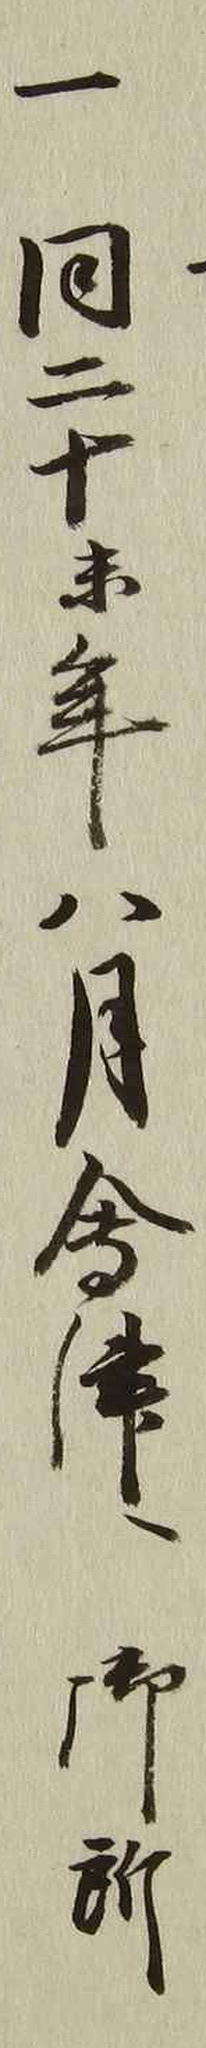一同二十未年八月会津へ御所
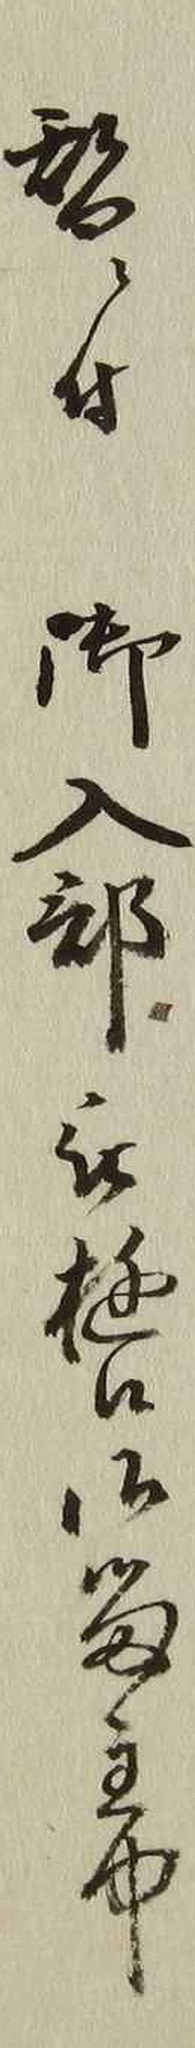替ニ付御入部被遊候御留主中
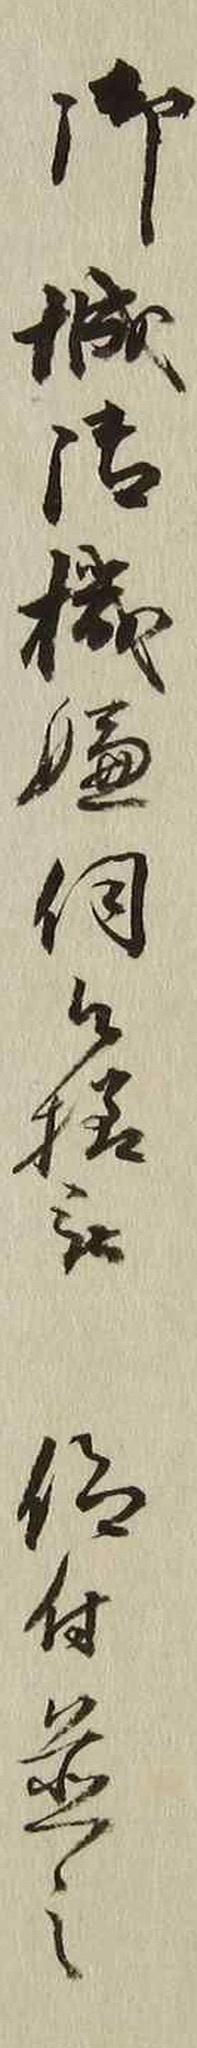御城御機嫌伺候様被仰付並之
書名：諸士系譜　巻之69　を之部3
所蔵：会津若松市立会津図書館
